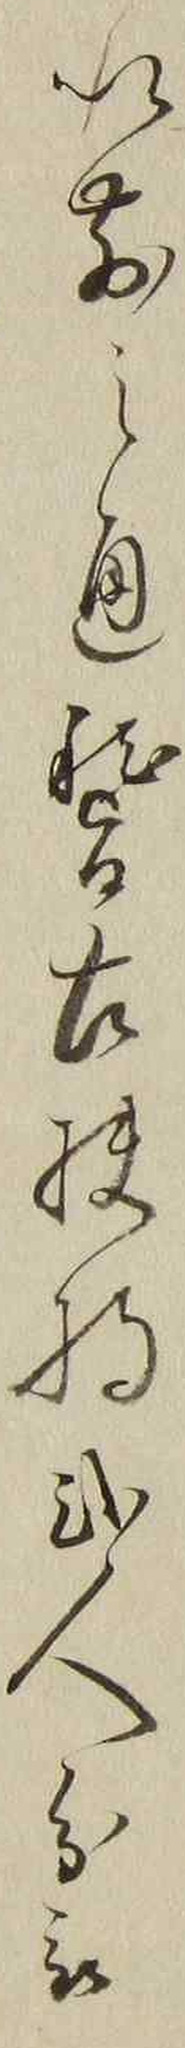以前之通稽古扶持弐人分被
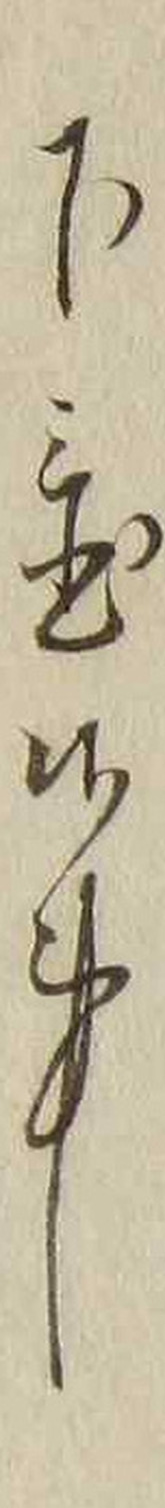下置候事
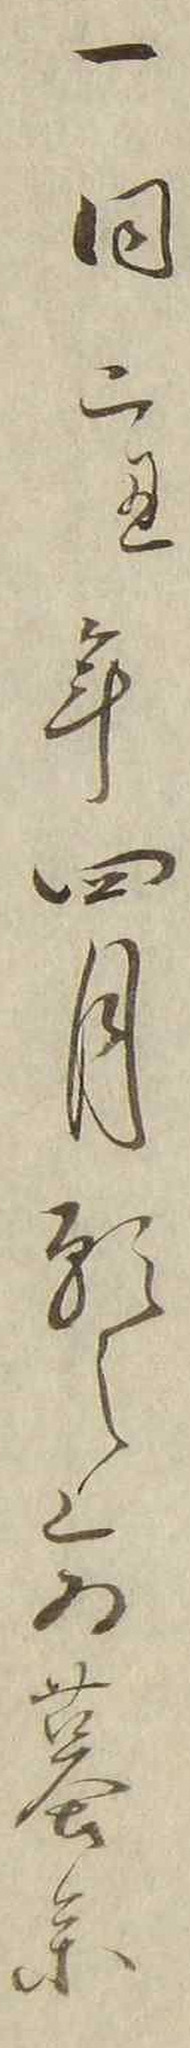一同二丑年四月願之上為墓参

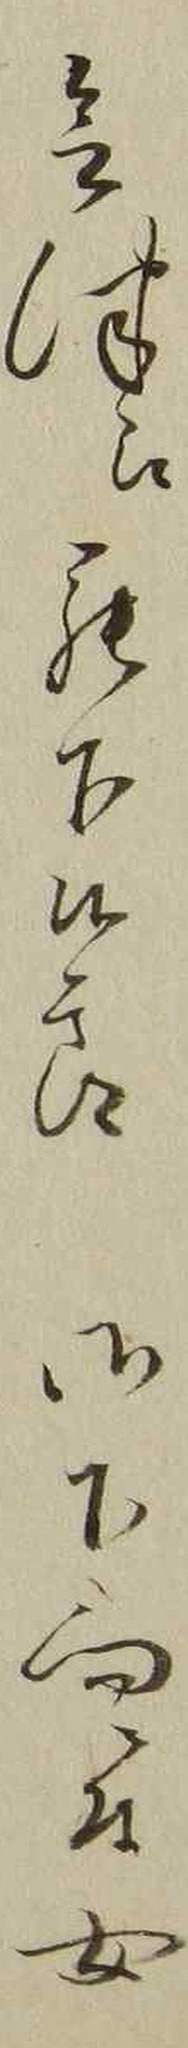会津江罷下候節御下向ニ付女
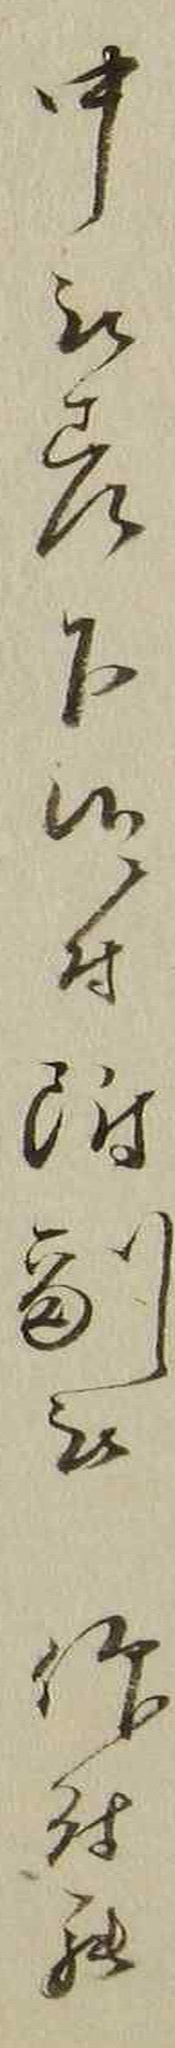中被差下候ニ付附副被仰付罷
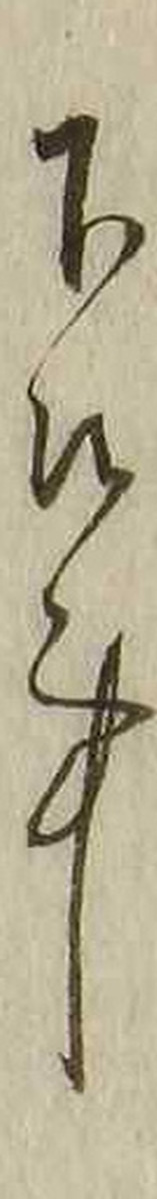下候事
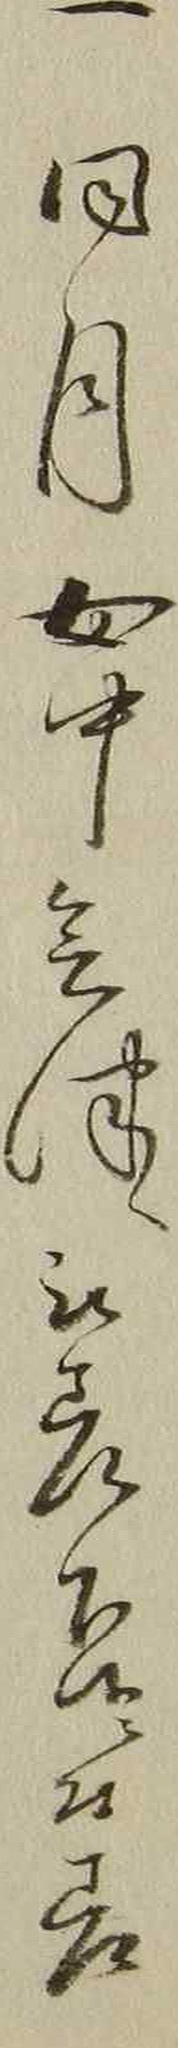一同月女中会津へ被差下候ニ付差
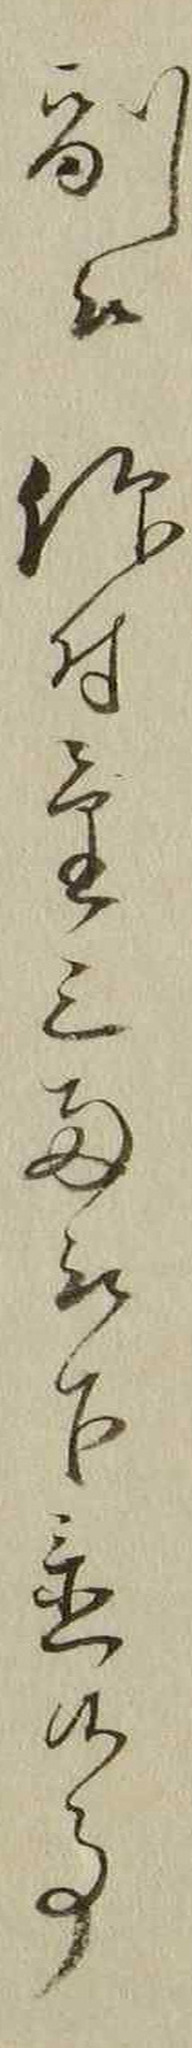副被仰付金三両被下置候事
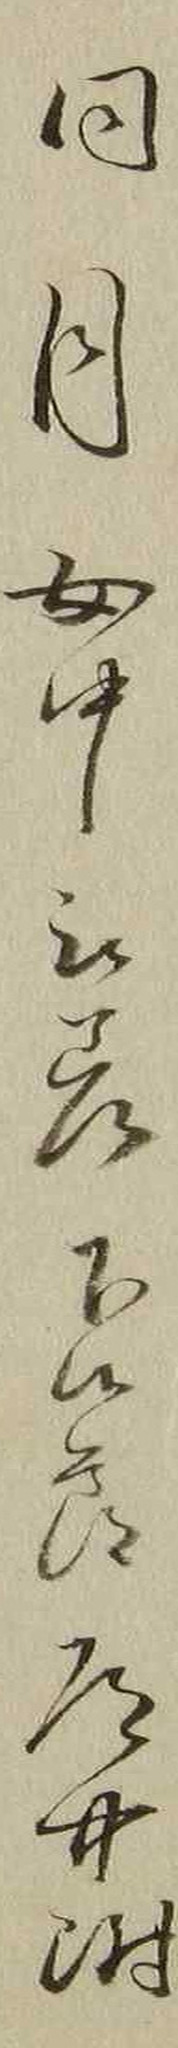一同月女中被差下候節道中附
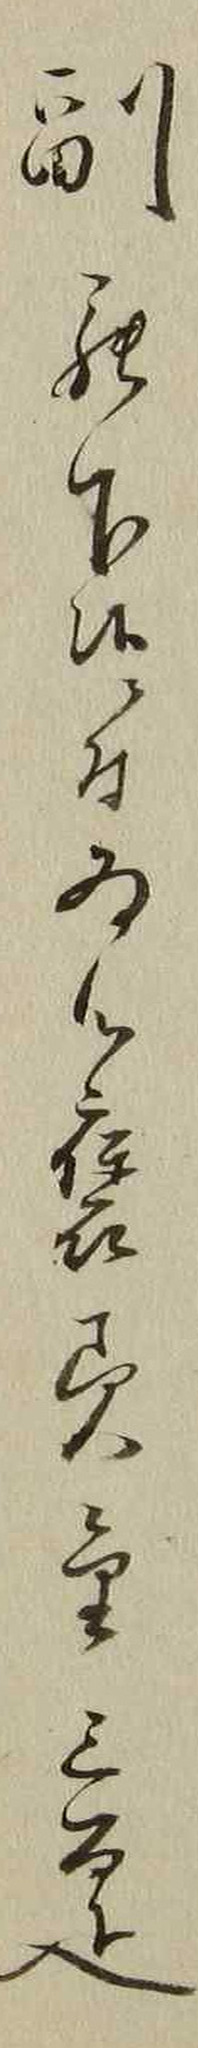副罷下候ニ付為御褒美金三百疋
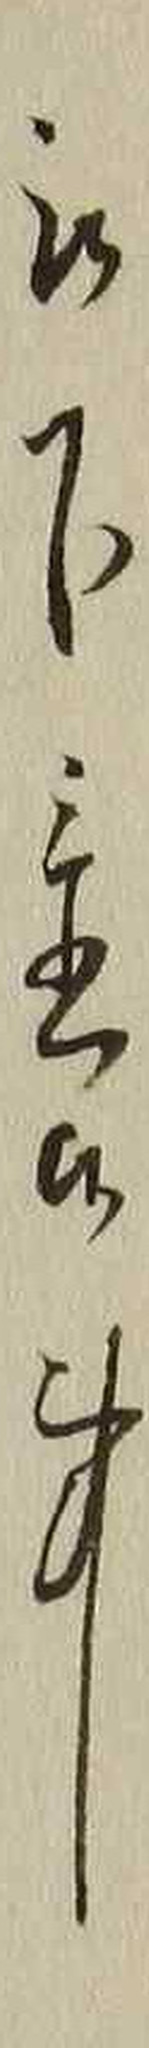被下置候事
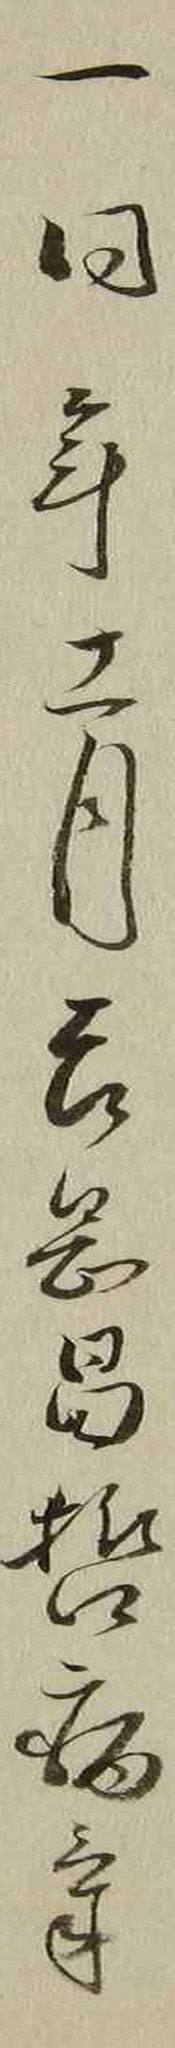一同年十一月吉岡昌哲病気
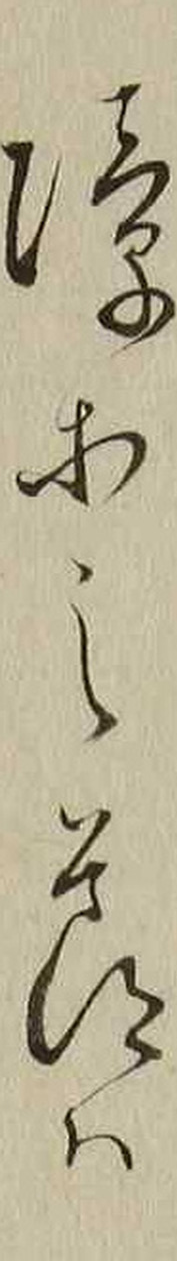障等之節ハ
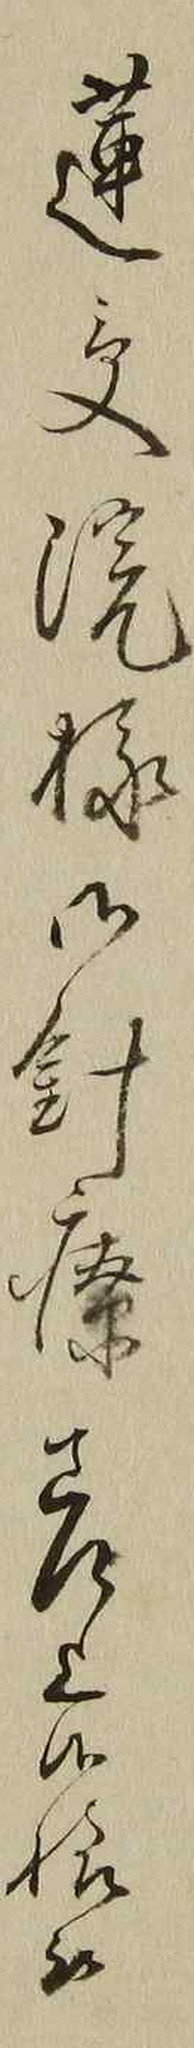蓮受院様御針療差上候様被
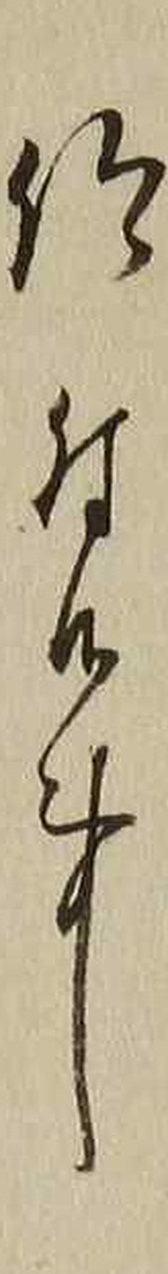仰付候事
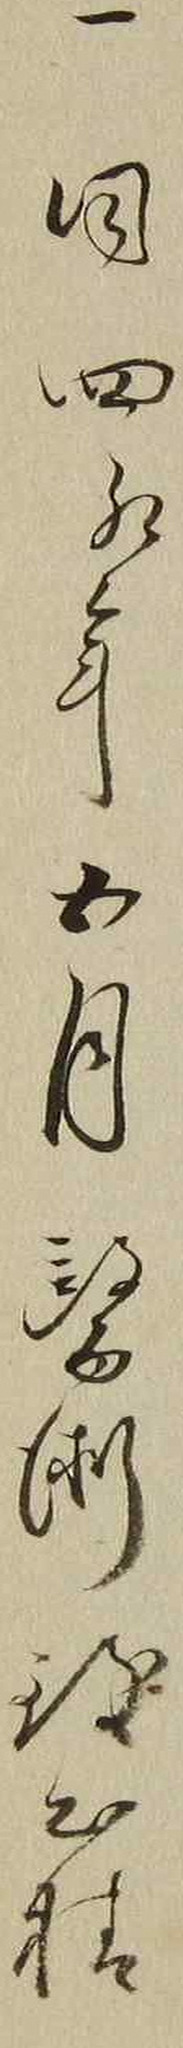一同四卯年五月医術致出精
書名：諸士系譜　巻之129　た之部5
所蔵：会津若松市立会津図書館
